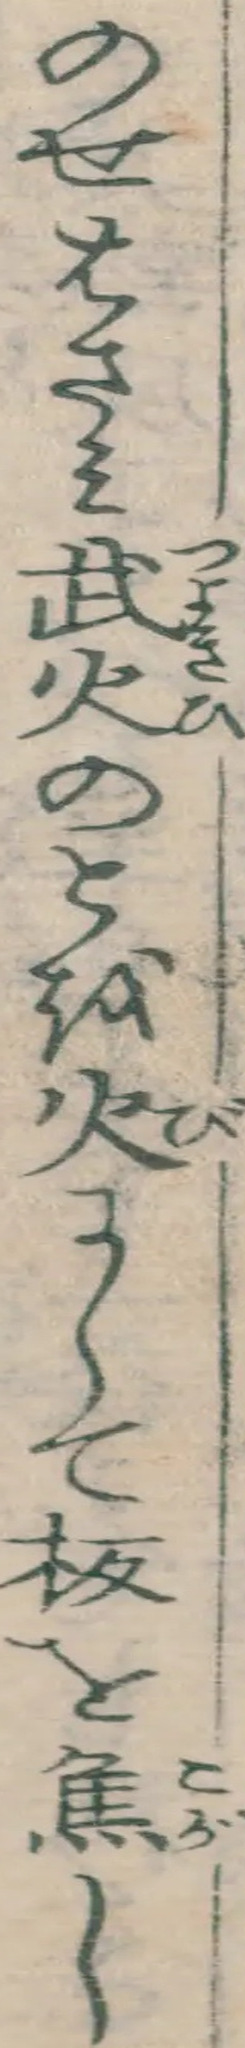のせはさみ武火のとを火にして板を焦し
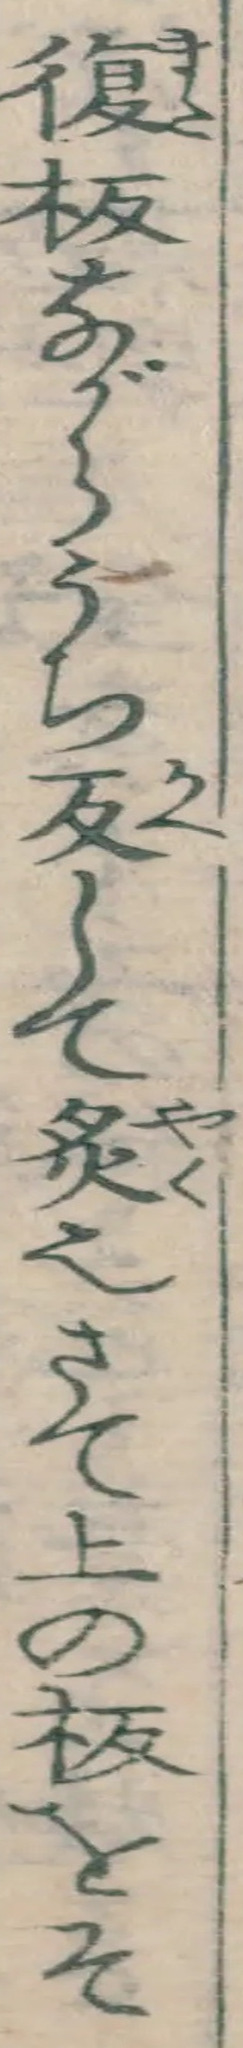復板ながらうち反して炙也さて上の板をそ
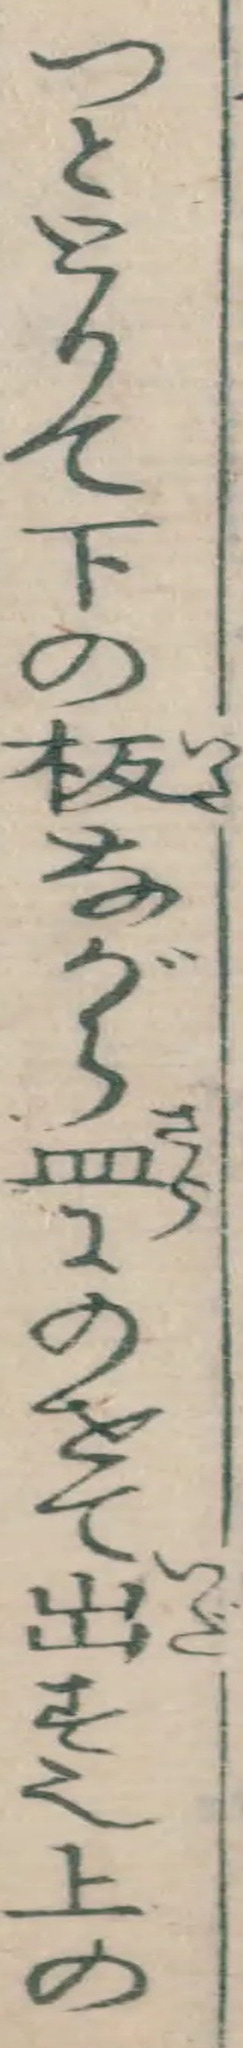つととりて下の板ながら皿にのせて出す也上の
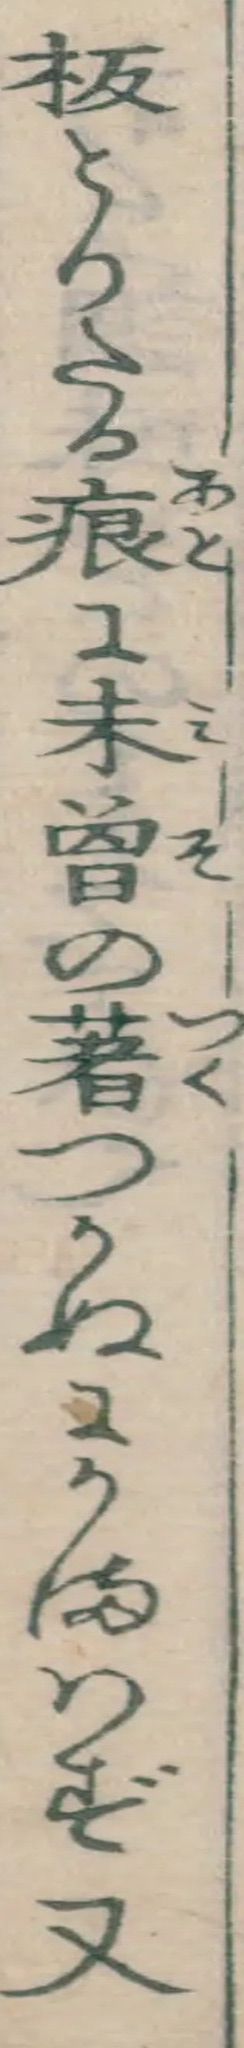板とりたる痕に未曽の著つかぬにかまはず又
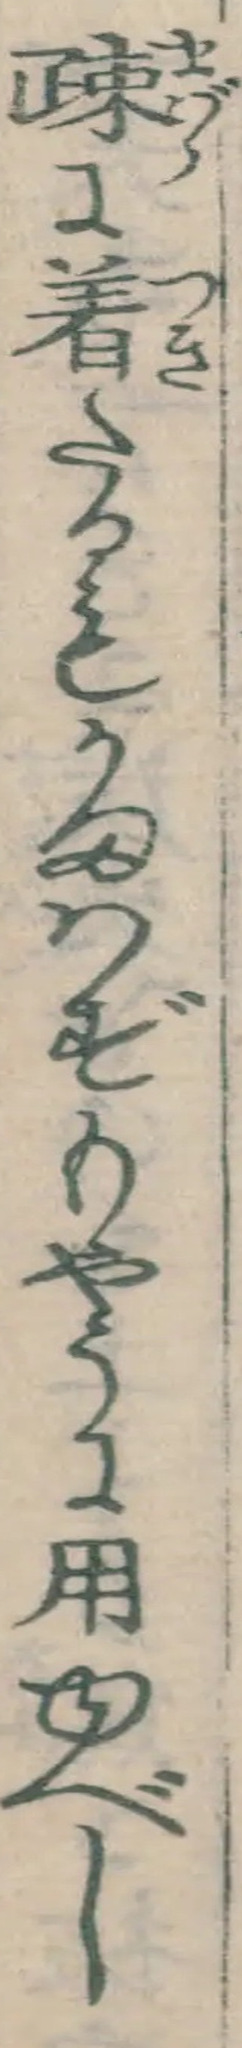疎に着たるもかまはずもやうに用ゆべし
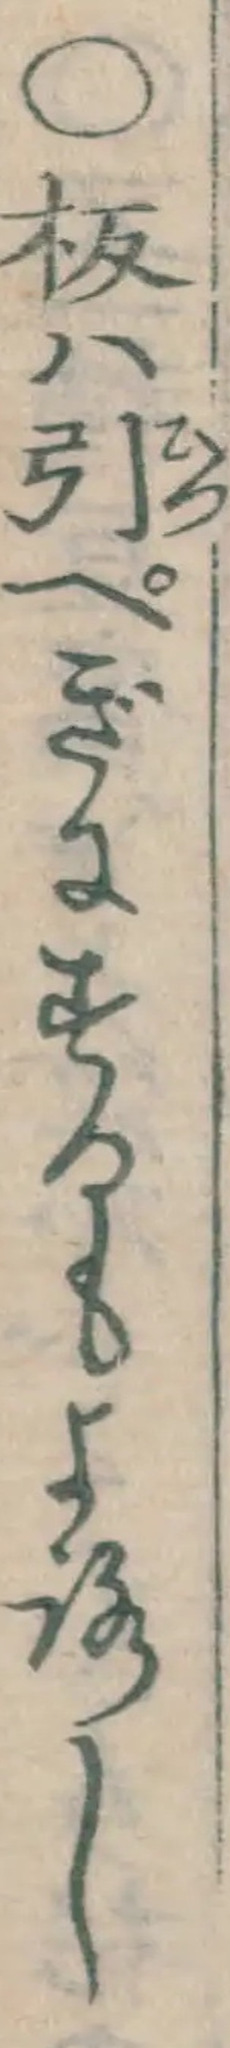○板は引ぺぎにするもよろし

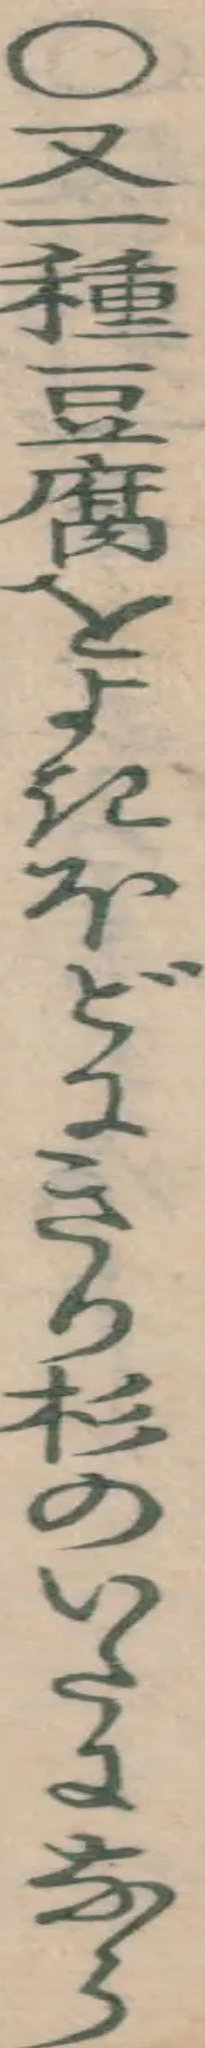○又一種豆腐をよきほどにきり杉のいたになら
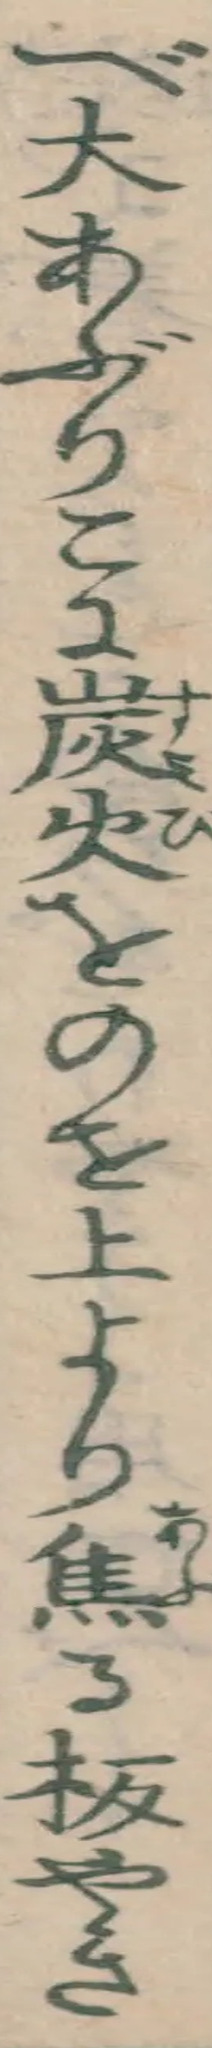べ大あぶりこに炭火をのせ上より焦る板やき
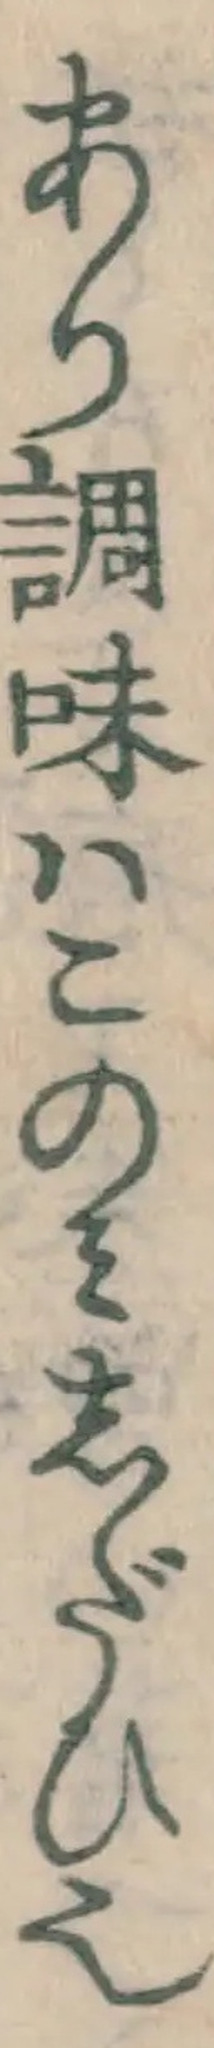あり調味はこのみしだひ也
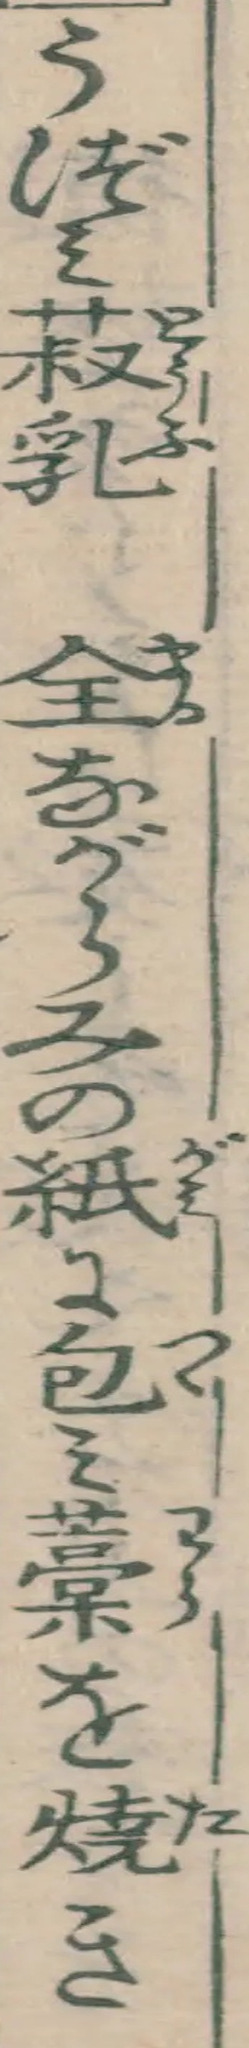四十三うずみ菽乳全ながらみの紙に包み藁を焼き
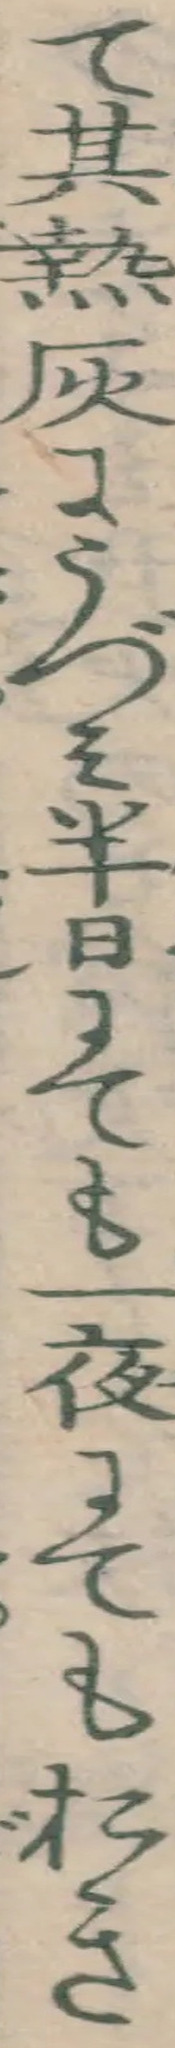て其熱灰にうづみ半日にても一夜にてもおき
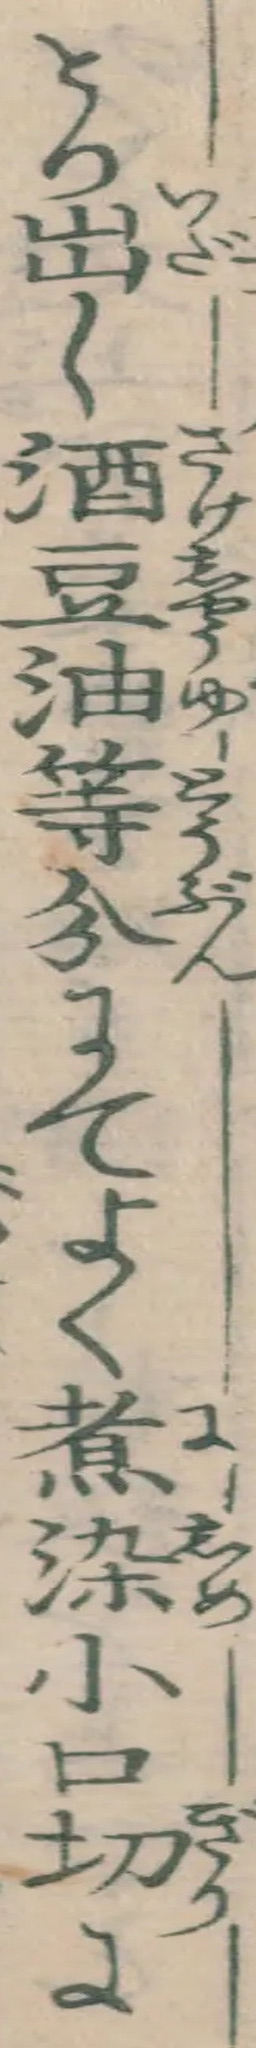とり出し酒豆油等分にてよく煮染小口切に
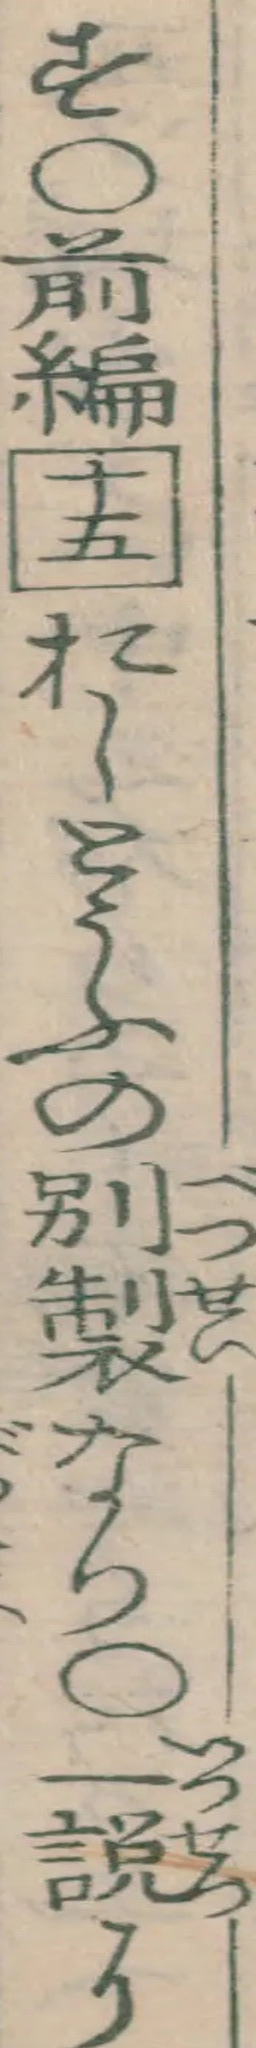す○前編十五おしとうふの別製なり○一説に
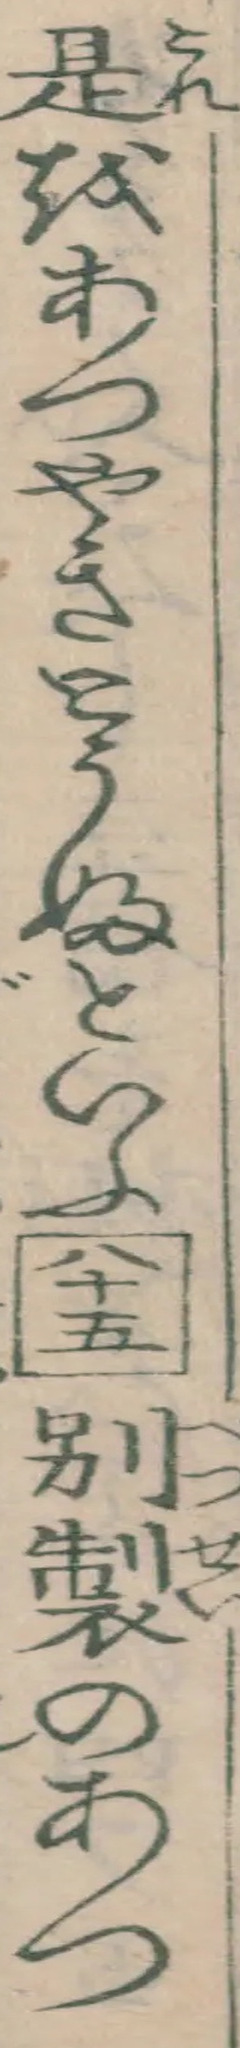是をあつやきとうふといふ八十五別製のあつ
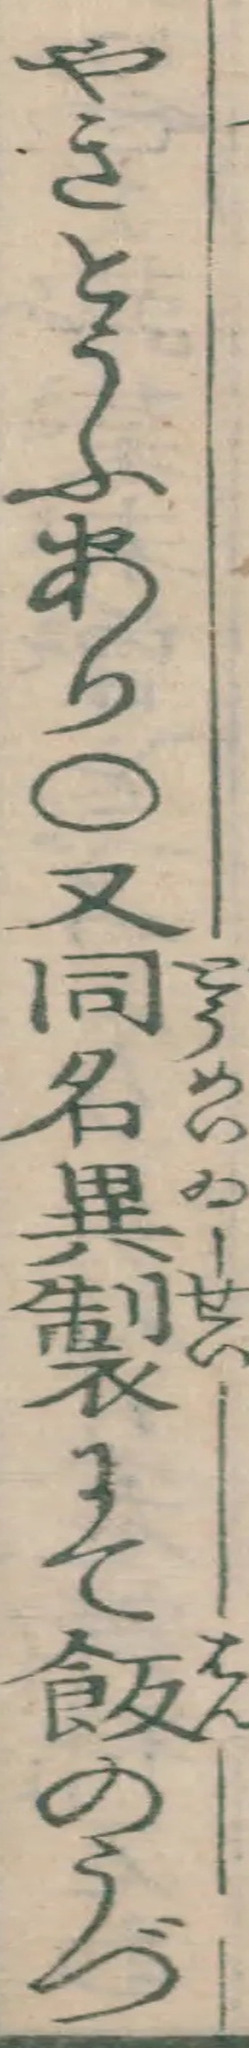やきとうふあり○又同名異製にて飯のうづ
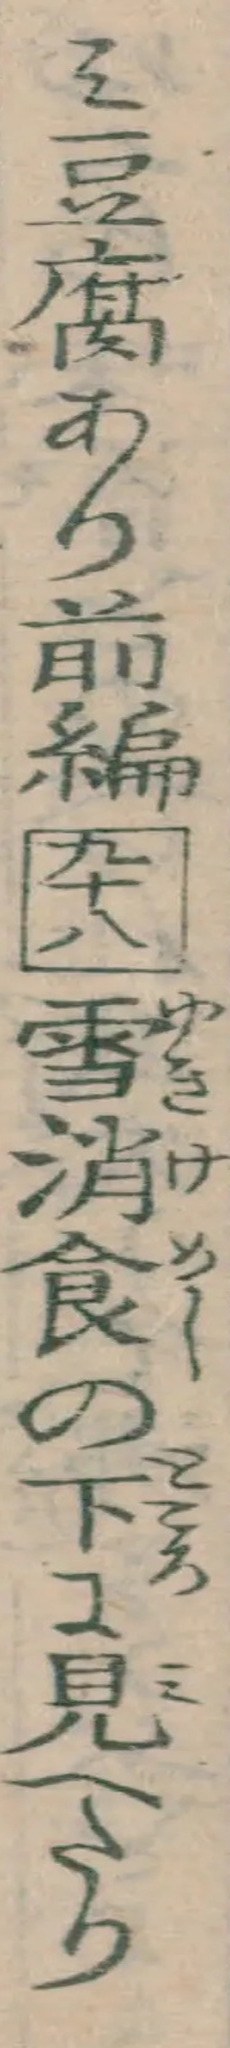み豆腐あり前編九十八雪消食の下に見へたり
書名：豆腐百珍. 続編
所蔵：国立国会図書館 National Diet Library, JAPAN
